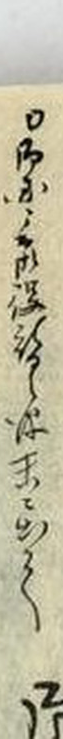〇御国ニ而御役替之儀末々出之
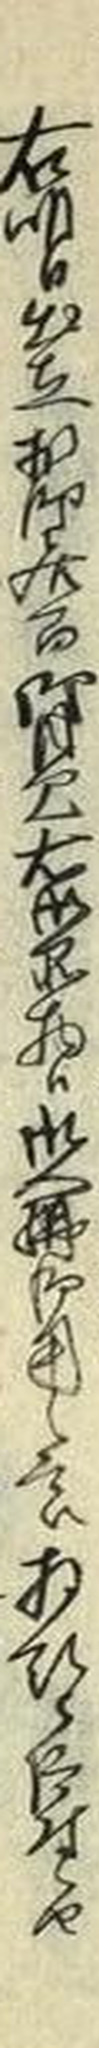右明日出立於御居間御目見右御品物ハ御人払御用之節拝領被仰付候由
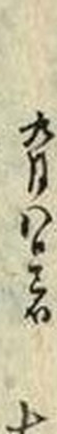九月八日着

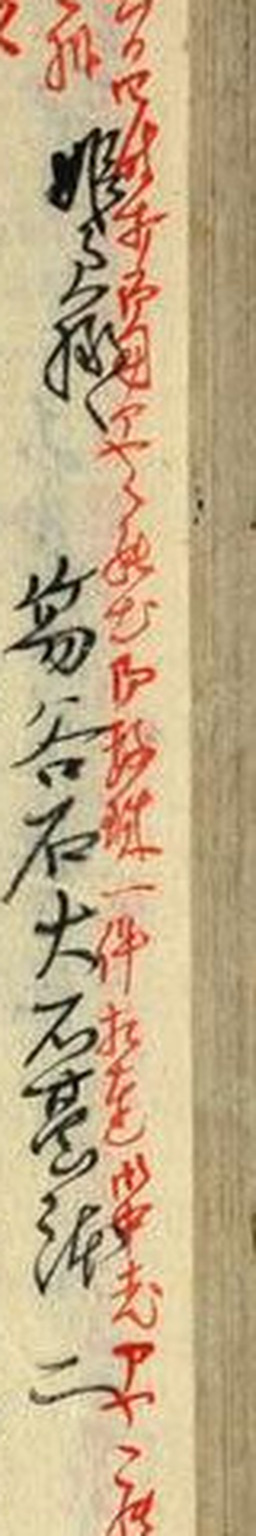姫君様へ笏谷石大石台鉢二
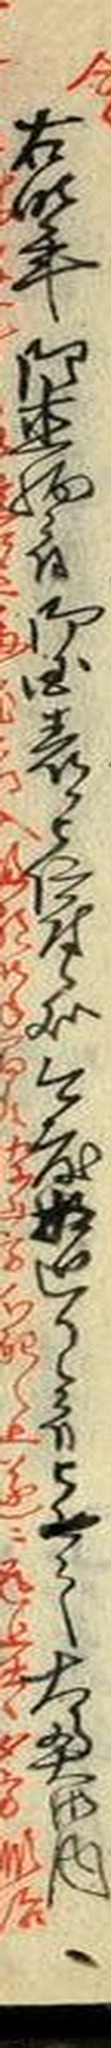右昨年御直約ニ付御国表へ被仰付候処今度相廻り候ニ付被之大奥御内
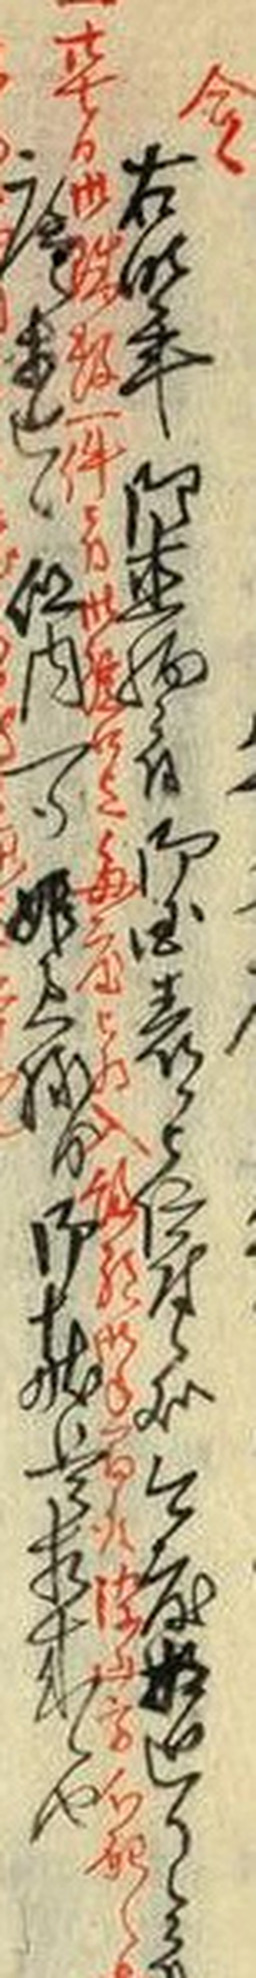庭へ相廻候但内一ツ姫君様ゟ御献上相成候由
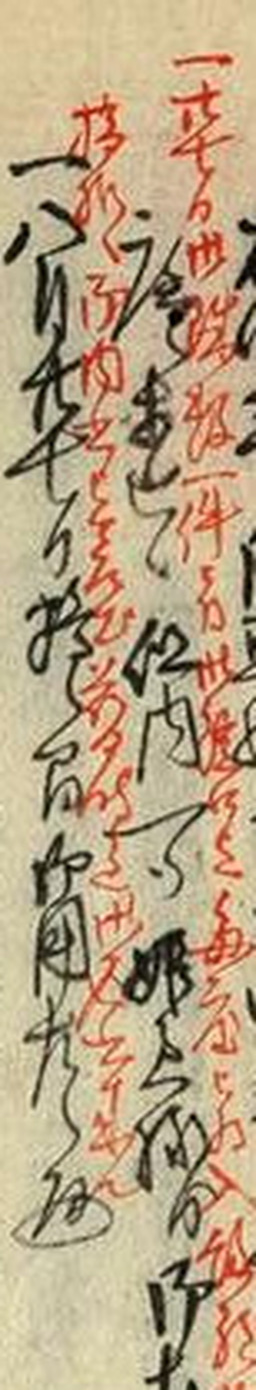一八月廿七日鶴之間御用左之通
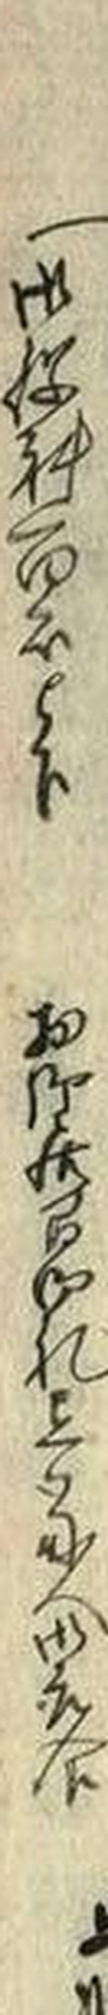御役料百石被下於御居間御礼申上御用人御取合
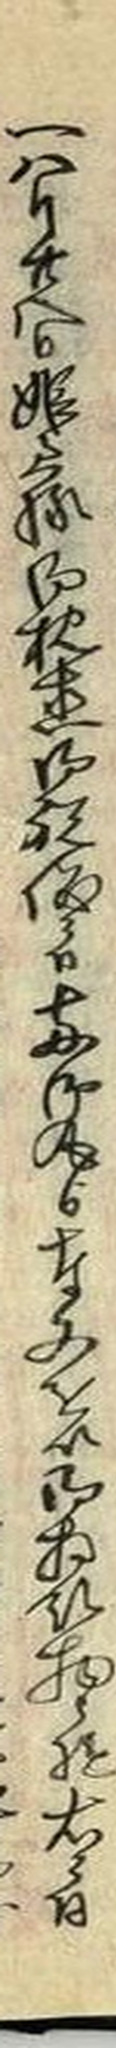一八月廿八日姫君様御枕直御祝儀ニ付両御丸ゟ奉文を以御拝領物被遊右ニ付
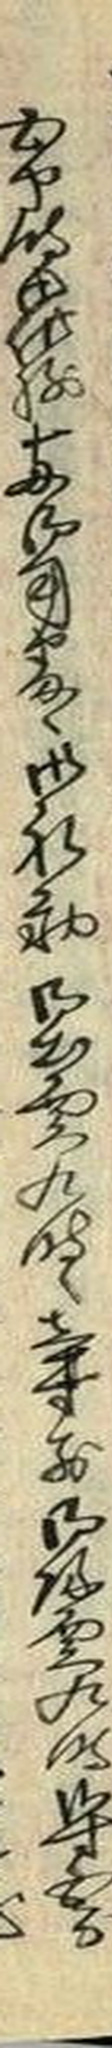五半時御供揃両御用番へ御礼勤御出殿九時へ壱寸前御帰殿九時弐寸五分
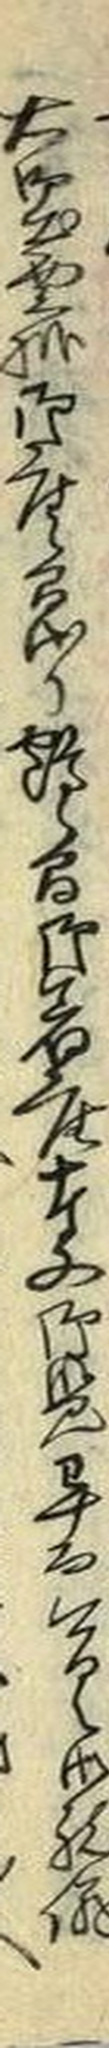右御出殿掛御座之間代り鶴之間御着座奉文御覧畢而今日之御祝儀
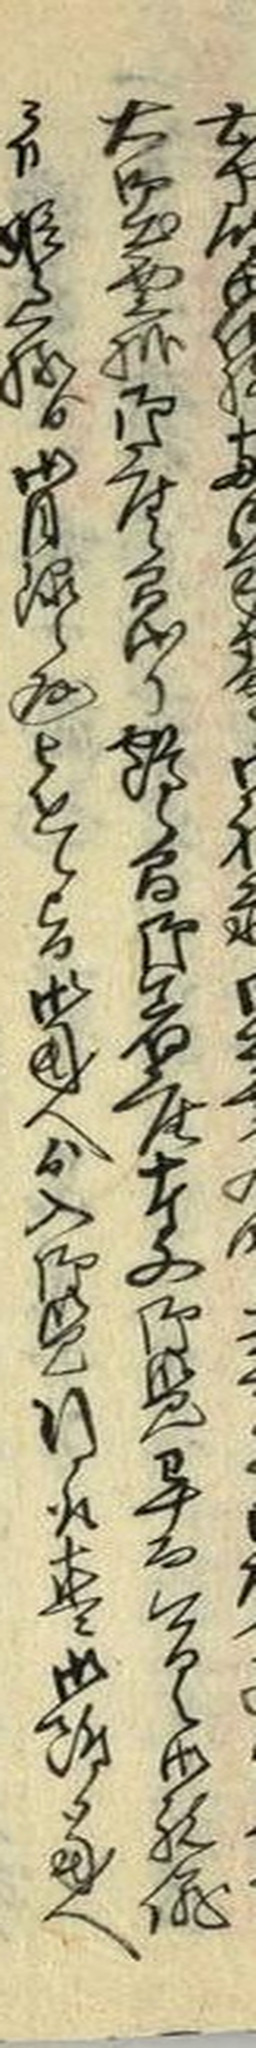ニ付姫君様ゟ御目録之通被進候旨御用人ゟ入御覧引取直々御附御用人
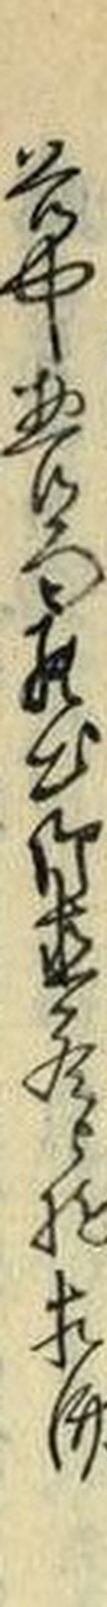谷中惣左衛門被罷出御直答被遊相済
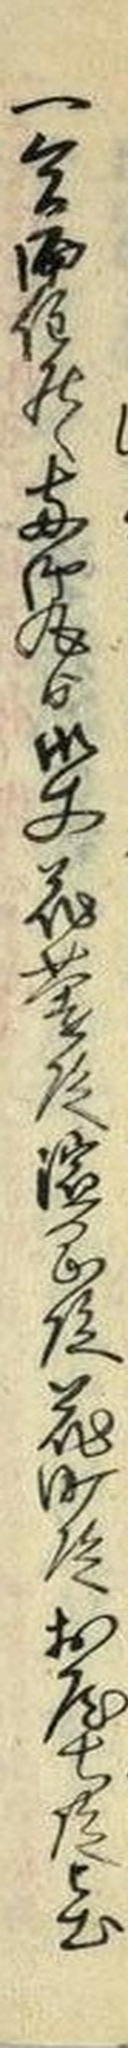一今日御住居へ両御丸ゟ御使花薗殿浜岡殿花町殿おやち殿被出
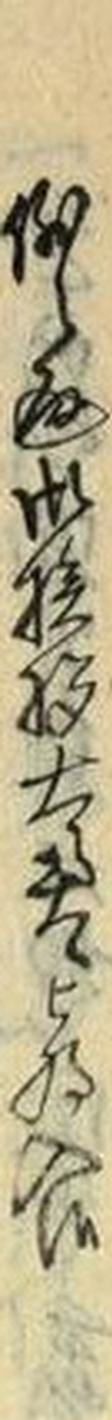例之通御挨拶大奥へ被為入候
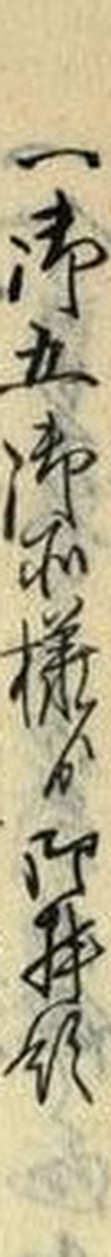一御五御所様ゟ御拝領
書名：少傅日録抄（斉承付側向頭取日記、在府）
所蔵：福井県文書館 Fukui Prefectural Archives
